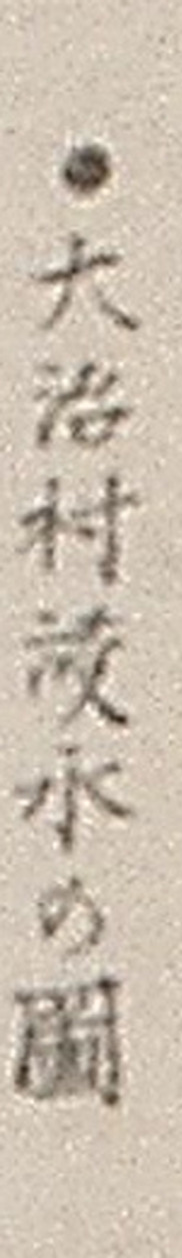●大治村浸水の圖
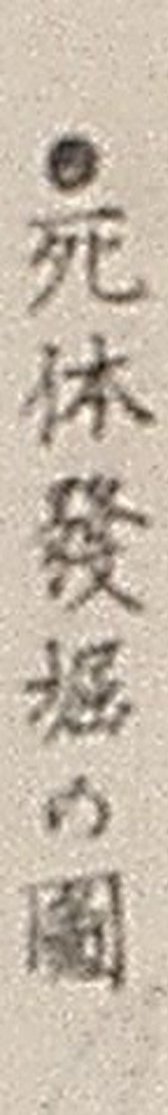●死体発掘の圖
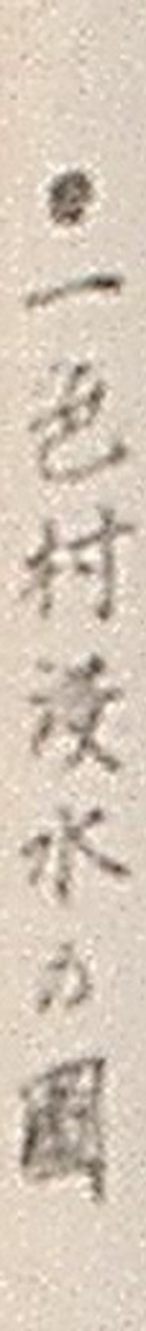●一色村浸水の圖
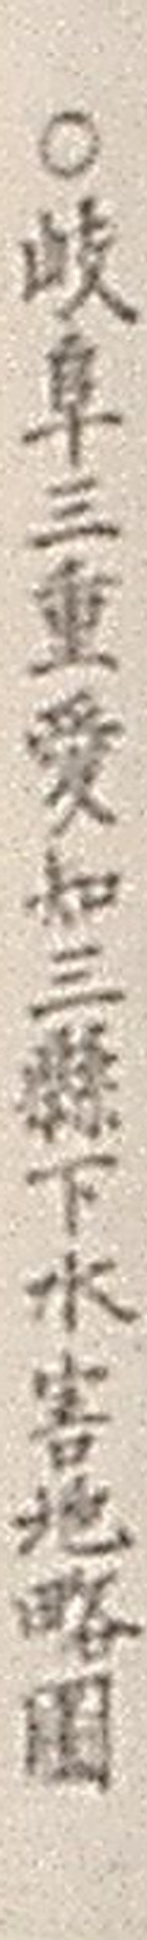◯岐阜三重愛知三県下水害地略ず
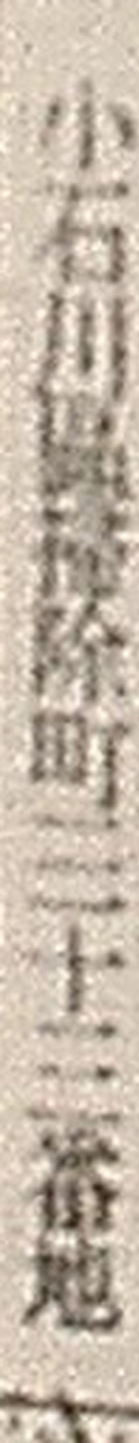小石川區掃除町三十三番地

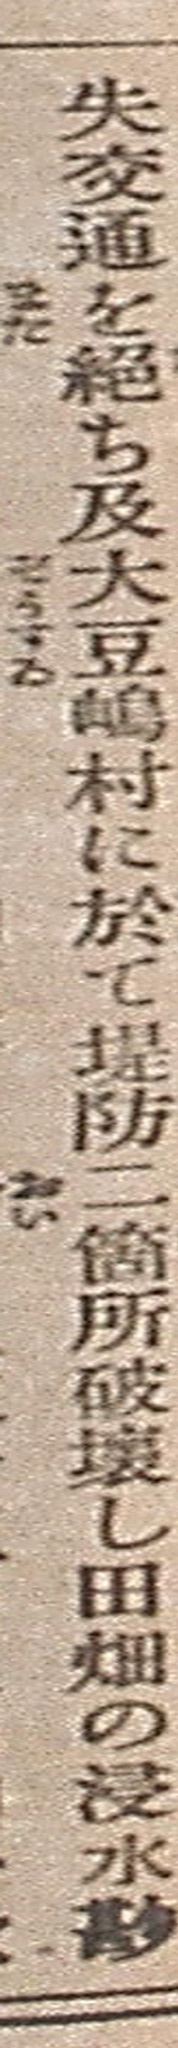失交通を絶ち及大豆嶋村に於て堤防二箇所破壊し田畑の浸水尠
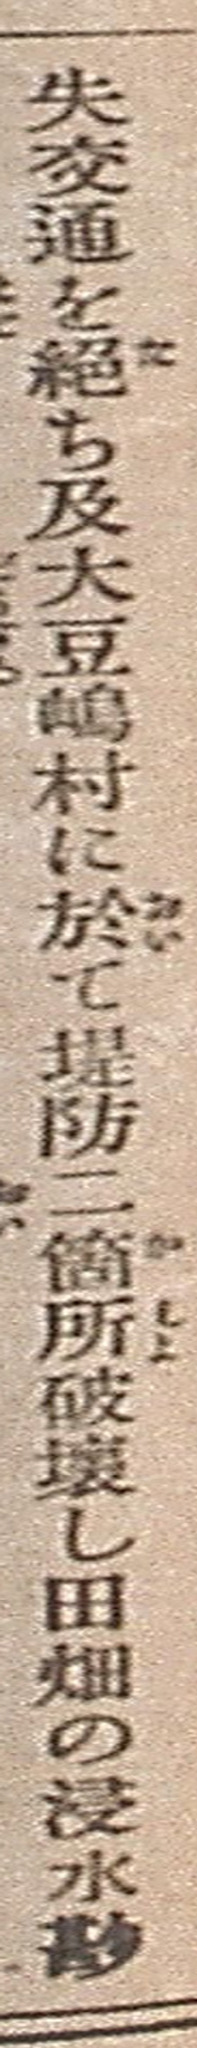失交通を絶ち及大豆嶋村に於て堤防二箇所破壊し田畑の浸水尠
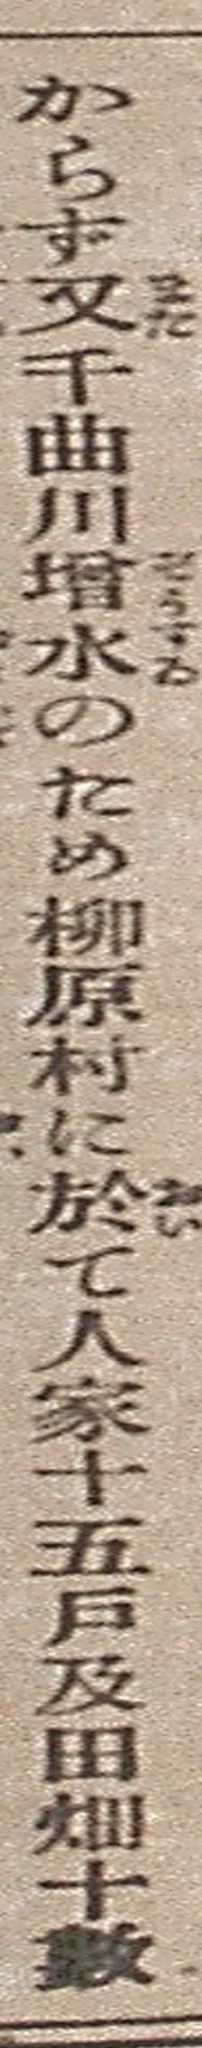からず又千曲川増水のため柳原村に於て人家十五戸及田畑十数
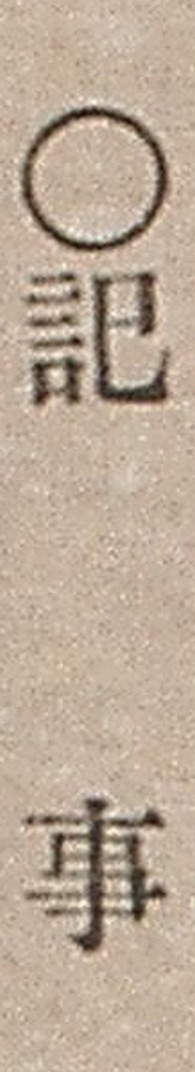◯記事
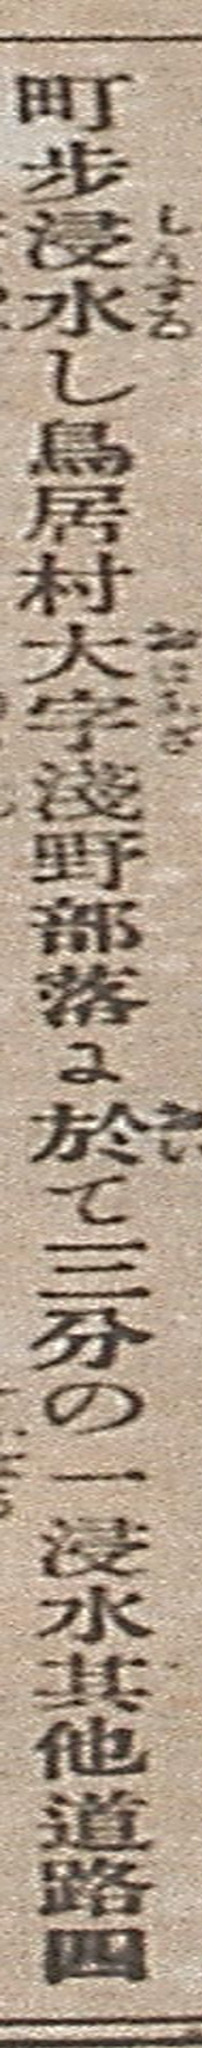町歩浸水し鳥居村大字浅野部落に於て三分の一浸水其他道路四
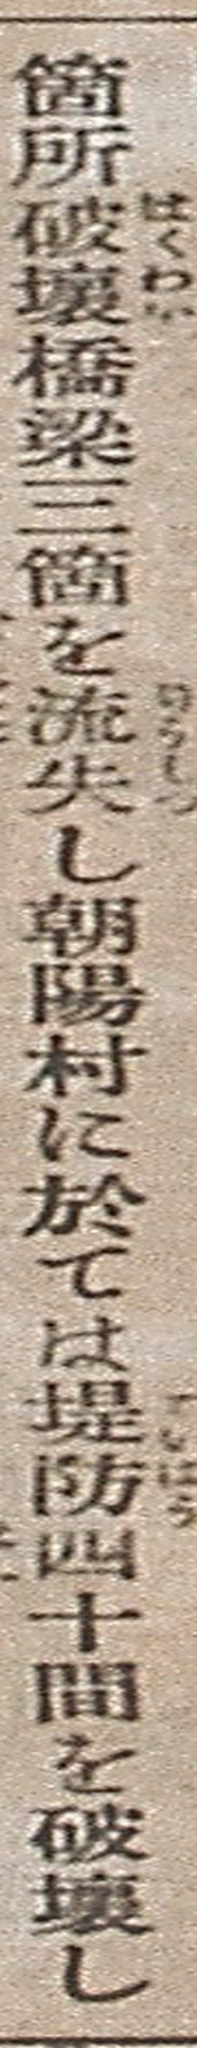箇所破壊橋梁三箇を流失し朝陽村に於ては堤防四十間を破壊し
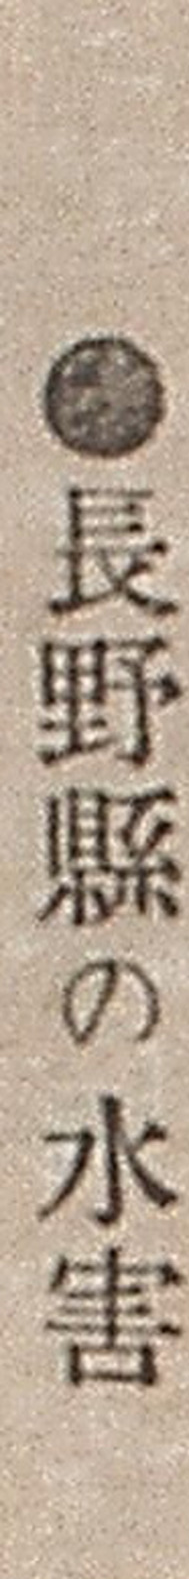●長野県の水害
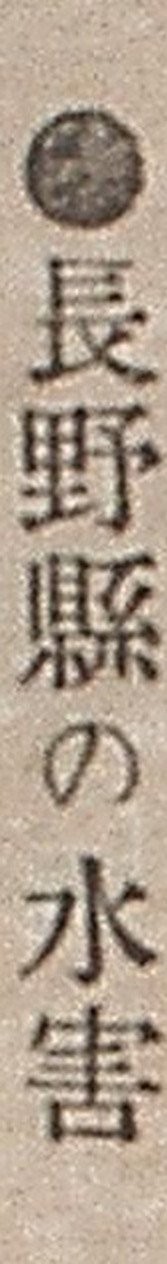●長野県の水害
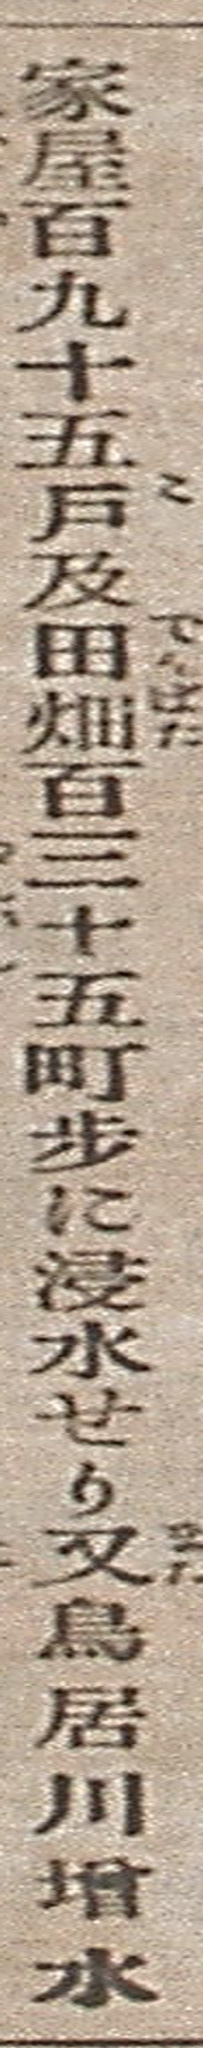家屋百九十五戸及田畑百三十五町歩に浸水せり又鳥居川増水
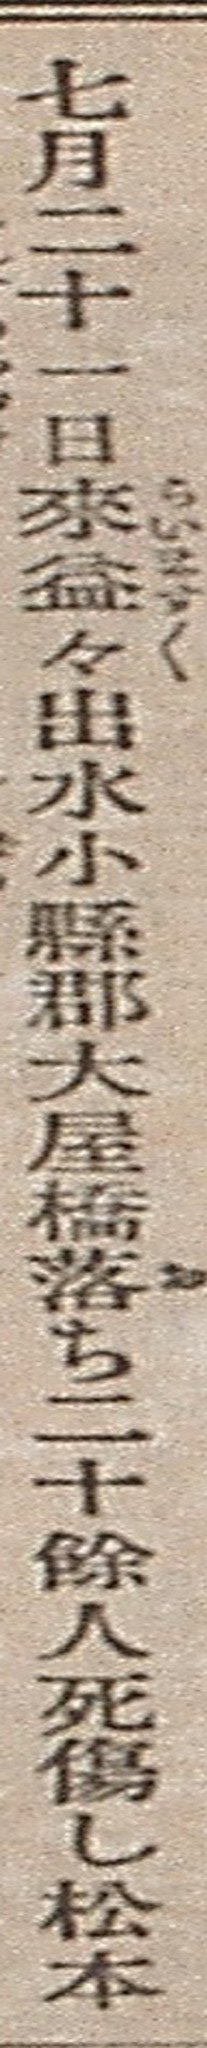七月二十一日來増々出水小県郡大屋橋落ち二十餘人死傷し松本
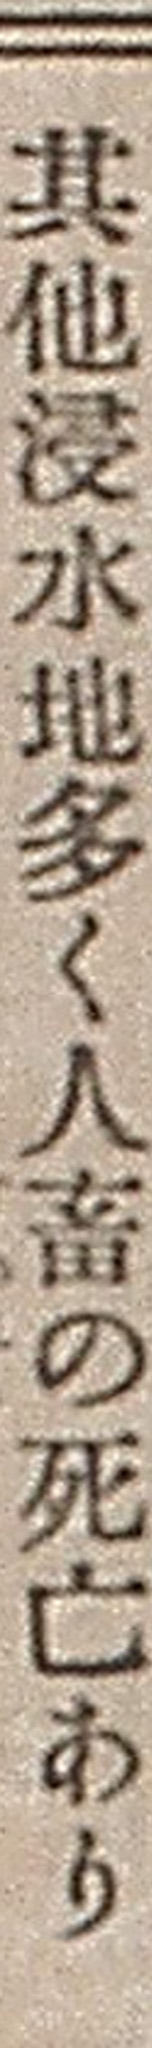其他浸水地多く人畜の死亡あり
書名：風俗畫報臨時増刊第百二十六號　洪水被害録（中）
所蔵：東京大学地震研究所図書室 Earthquake Research Institute Library, The University of Tokyo, JAPAN
